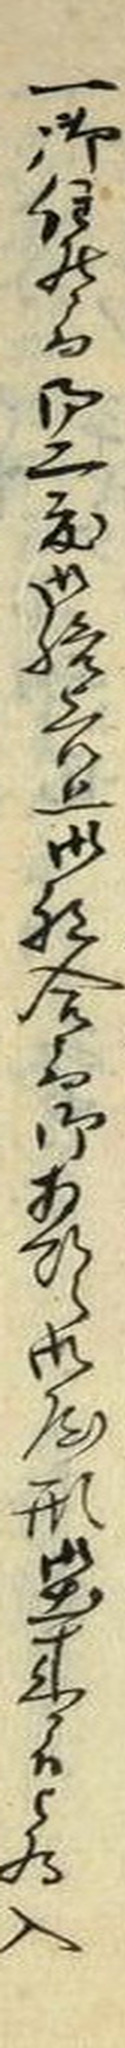一御住居ニ而御二度御膳被召上御程合ニ而御拝領之御屋形御出来候ニ付被為入
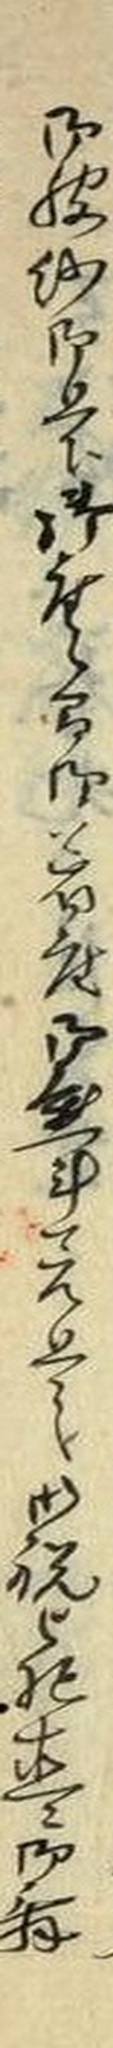御服紗御上下御座之間御着座御熨斗差上之御祝被遊直ニ御舞
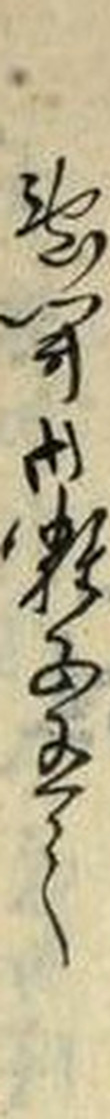台開御囃子有之

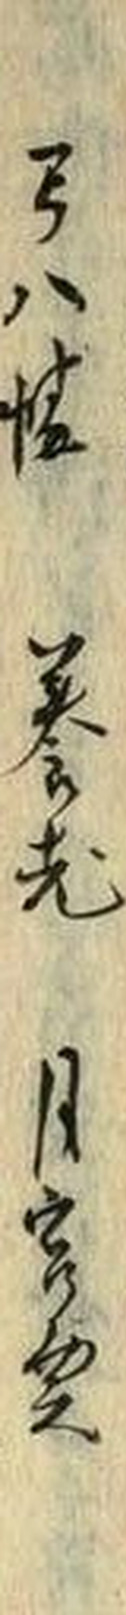弓八幡養老月宮殿
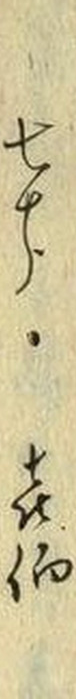七十郎喜伯
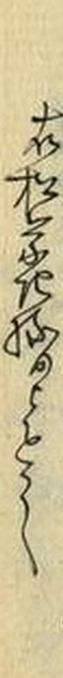右松栄院様ゟ被進之
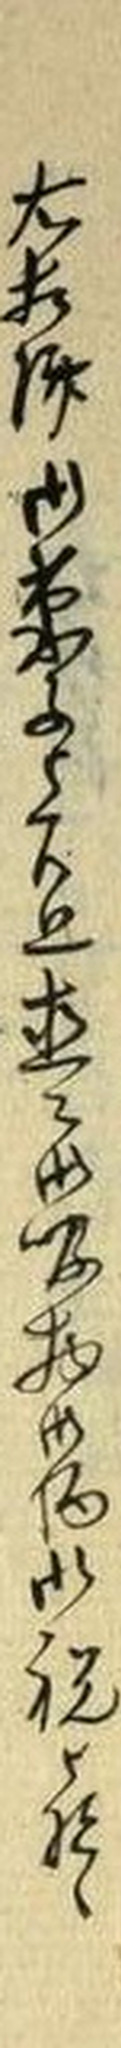右相済御菓子被召上直ニ御吸物御酒御祝被遊候
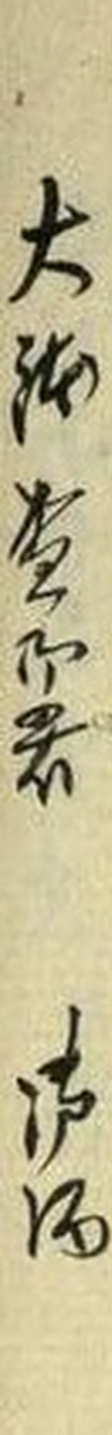大鉢盛御肴御酒
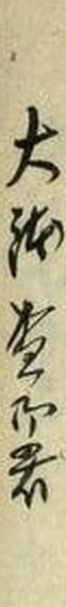大鉢盛御肴御酒
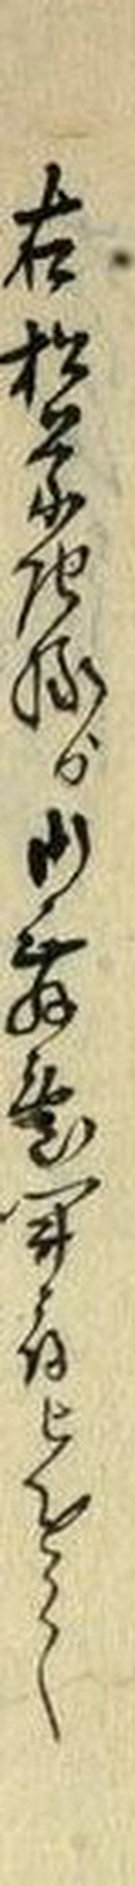右松栄院様ゟ御舞台開ニ付被進之
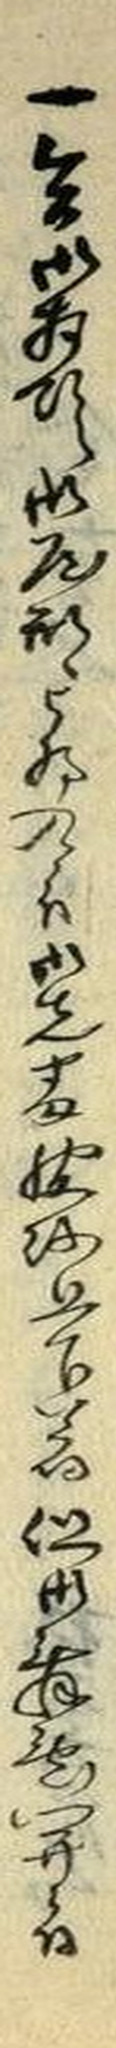一今日御拝領御屋形へ被為入候ニ付御先番服紗上下着但御舞台開ニ付
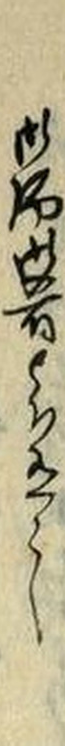御酒御肴被下有之
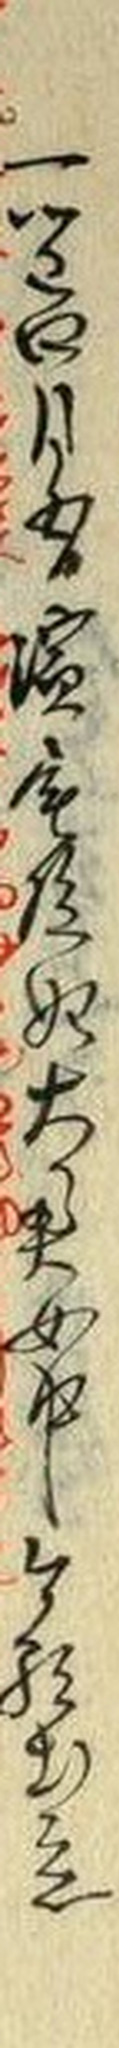一閏四月五日浜尾殿始大奥女中今朝出立
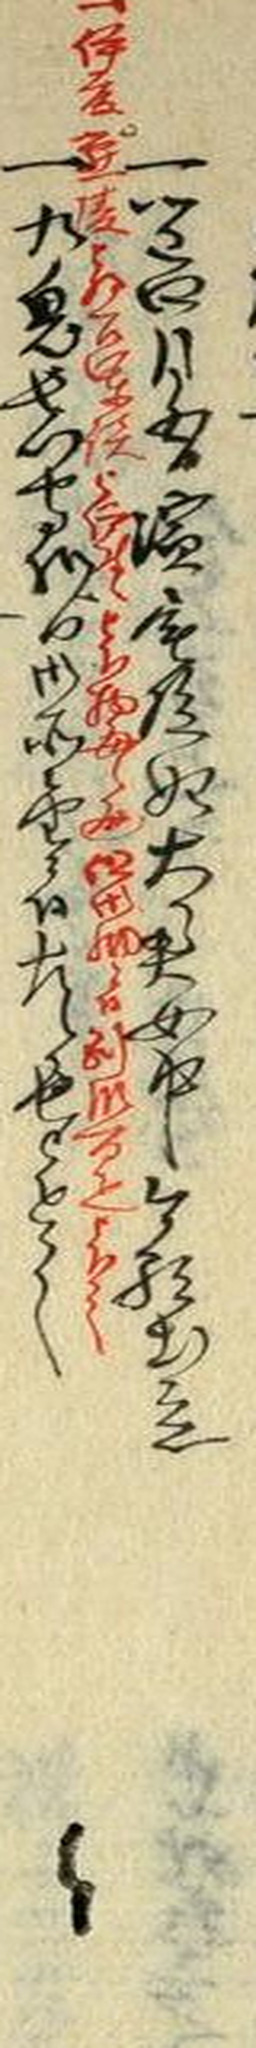一九鬼長門守様ゟ御所望ニ付左之通被進之
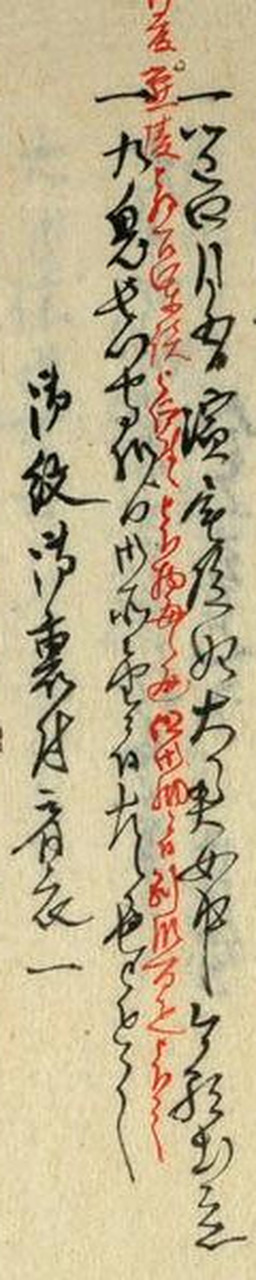一九鬼長門守様ゟ御所望ニ付左之通被進之
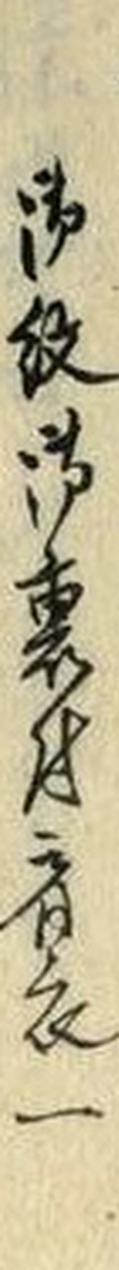御紋御裏付肩衣一
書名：少傅日録抄（斉善付側向頭取日記、江戸并道中、初入在国、逝去後…
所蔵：福井県文書館 Fukui Prefectural Archives
